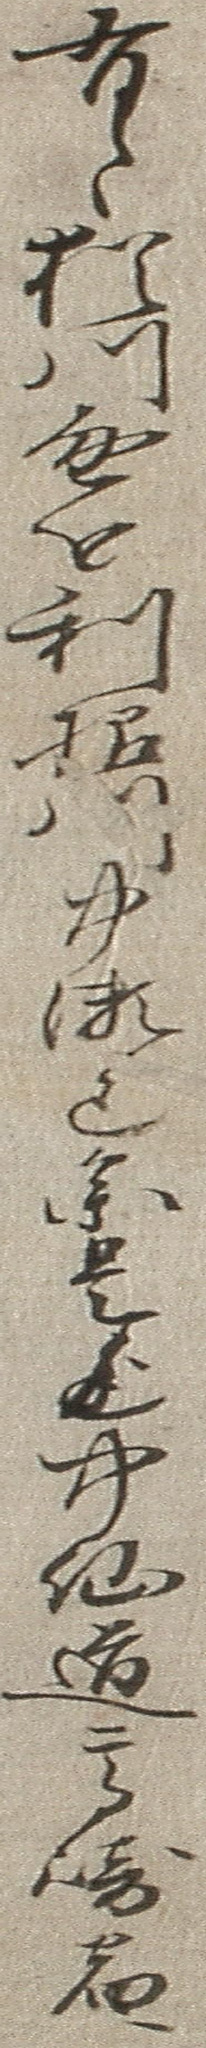有之候猶川通を利根川中瀬迄参是ゟ中仙道高崎宿へ
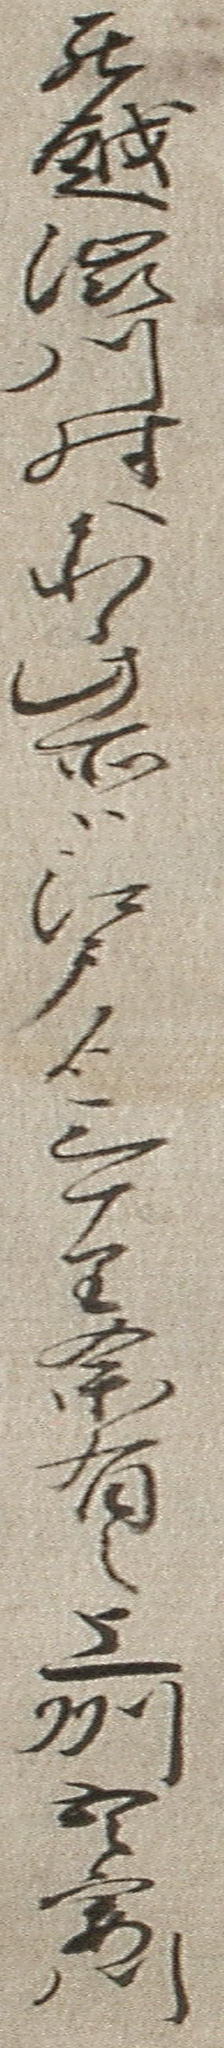罷越渋川村へ参候此所は江戸ゟ三十里余有之上州吾妻川
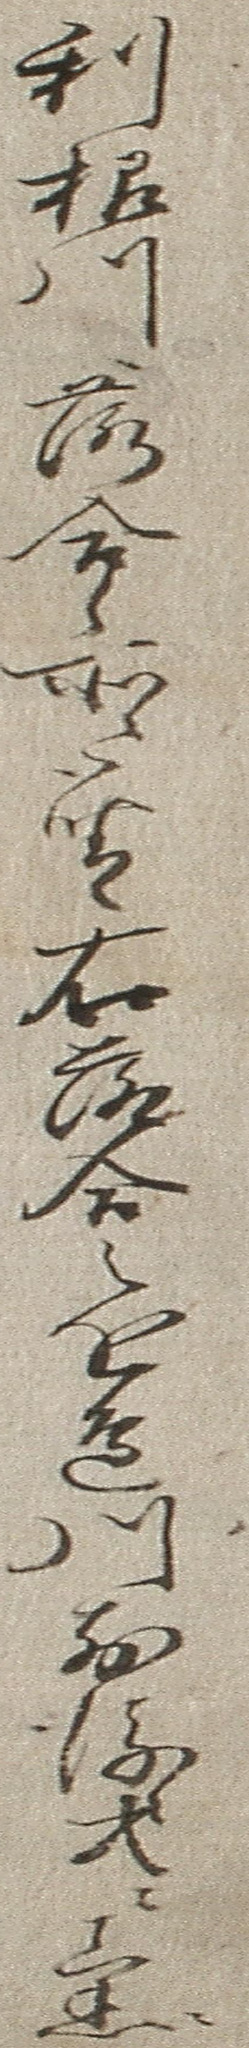利根川へ落合候所に御座候右落合之近辺川前後共に真黒に
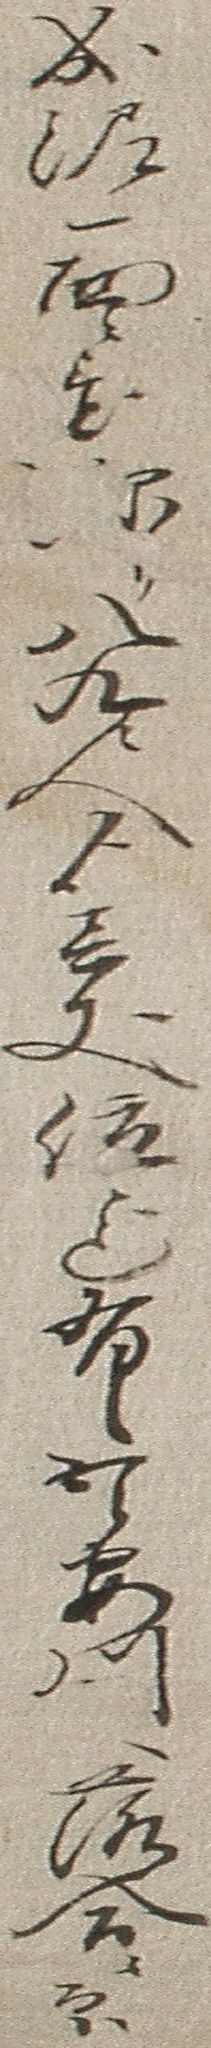成泥一面に置深さ八九尺ゟ壱丈位迄有之吾妻川へ落合に而は
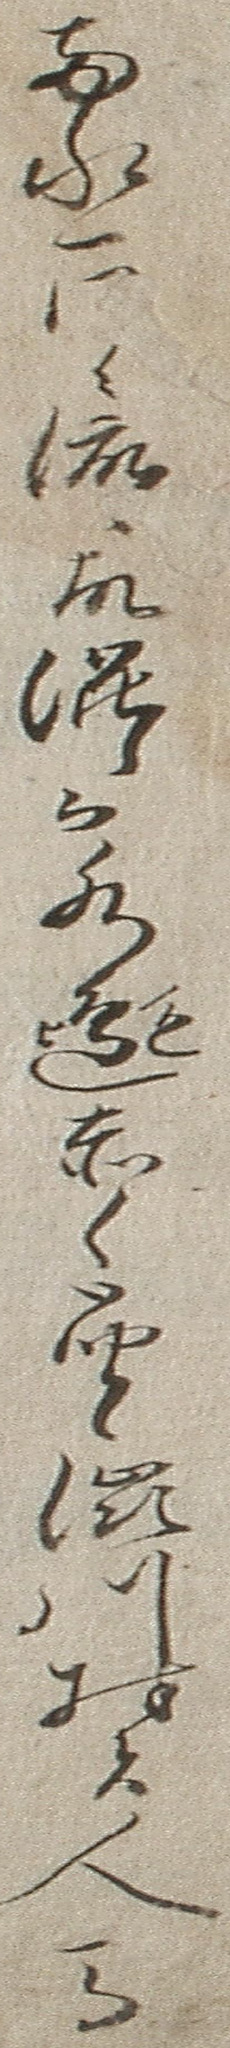兩水一同に流候故混候而水辺色赤く御座候渋川村者人馬
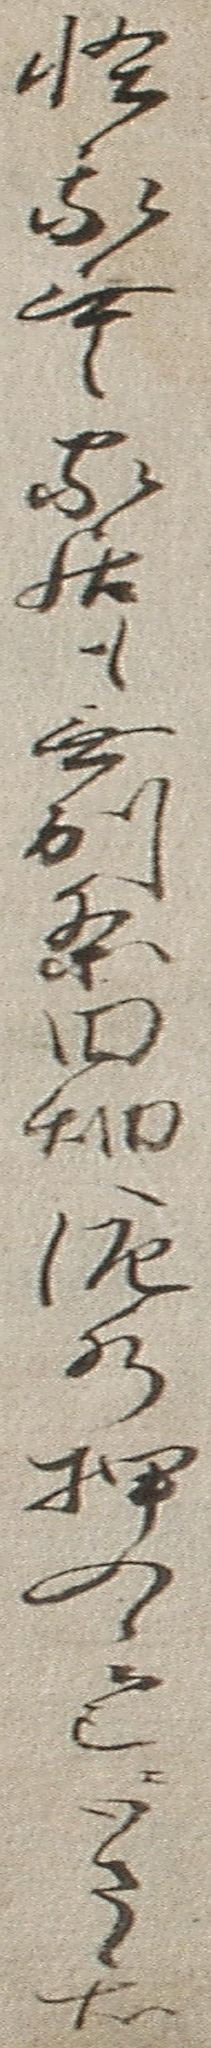怪我無之家居も無別状田畑へ泥水押入候而已に御さ候右
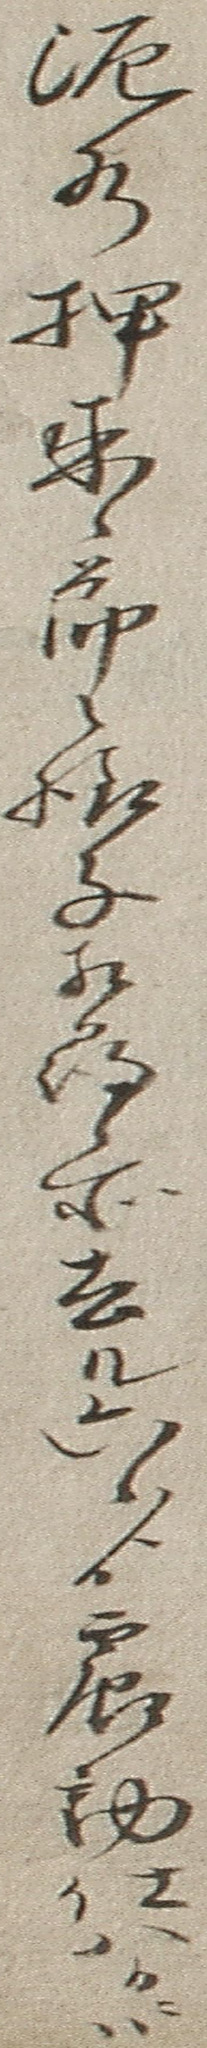泥水押来候節之様子相尋候所去る六日ゟ震動仕八日には

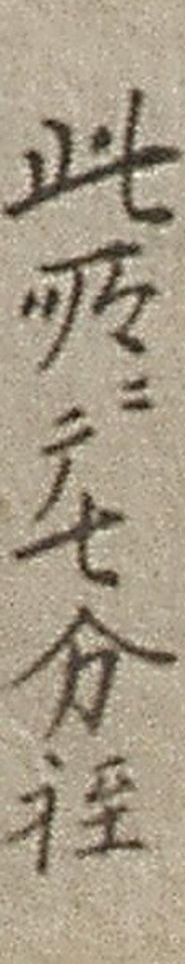此所ニテ七分程
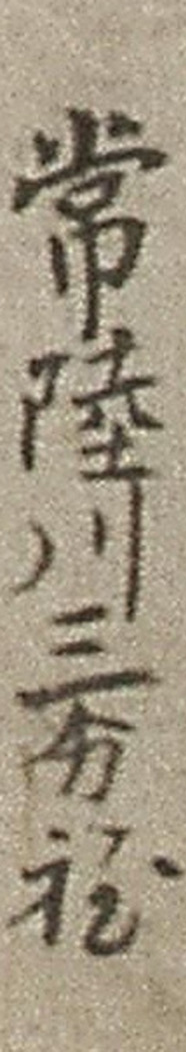常陸川三分程
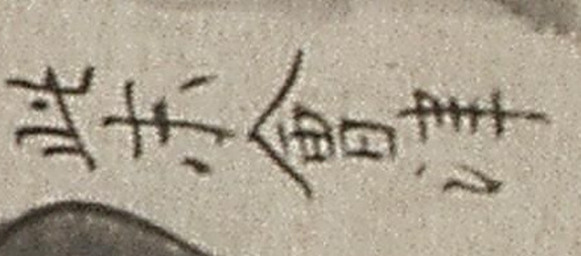此末会津
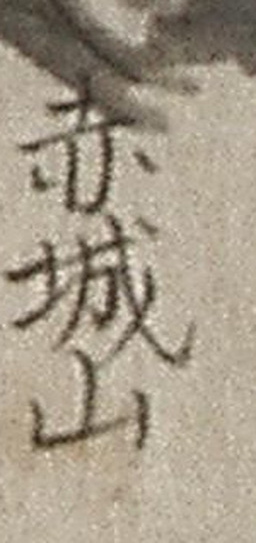赤城山
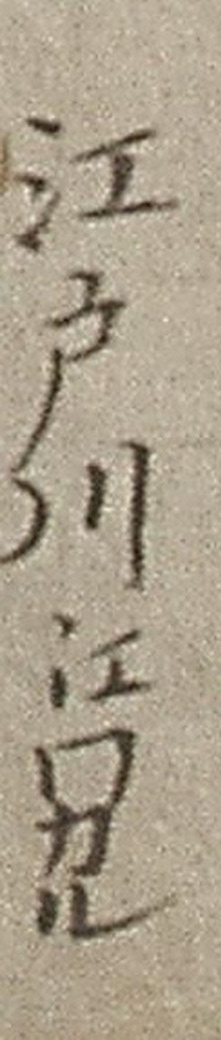江戸川江ワカル
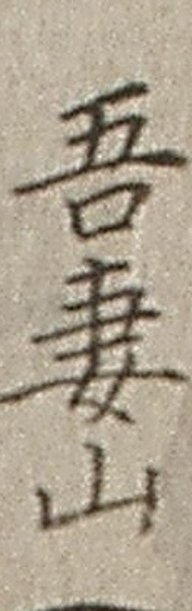吾妻山
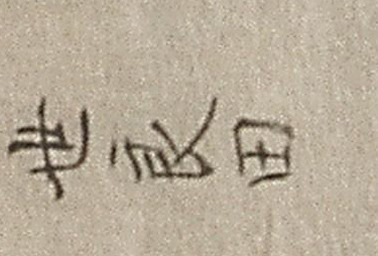世良田
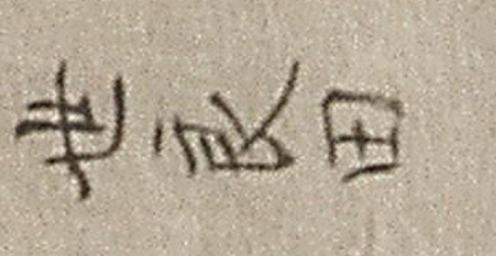世良田
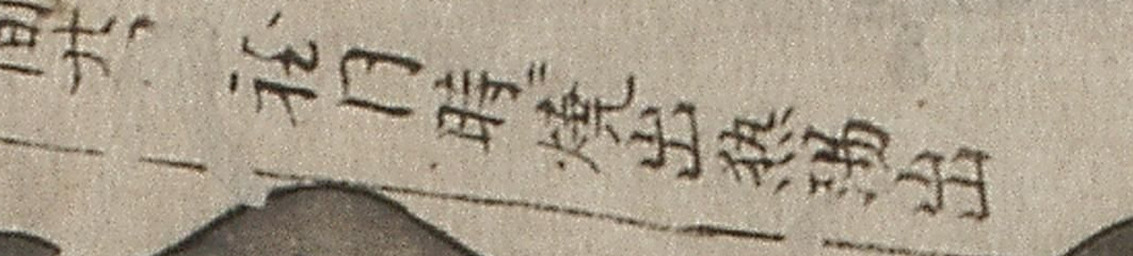此間廿程同時に焼出熱湯出
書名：太平秘録抜書　浅間山燒及普賢山崩
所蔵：東京大学地震研究所図書室 Earthquake Research Institute Library, The University of Tokyo, JAPAN
